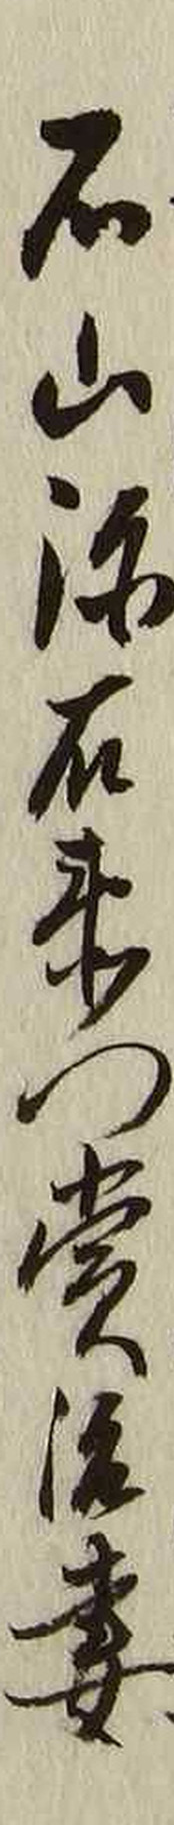石山弥石衛門賞治妻
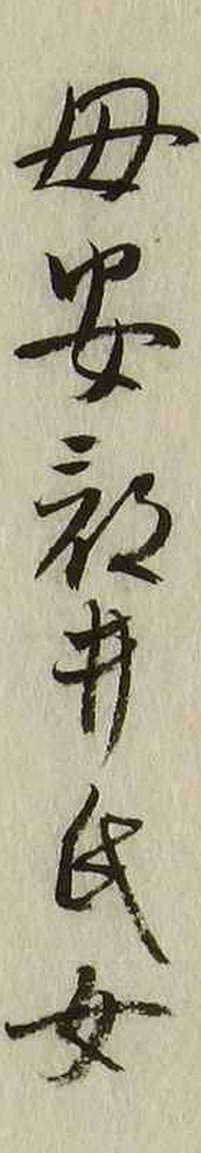母安部井氏女
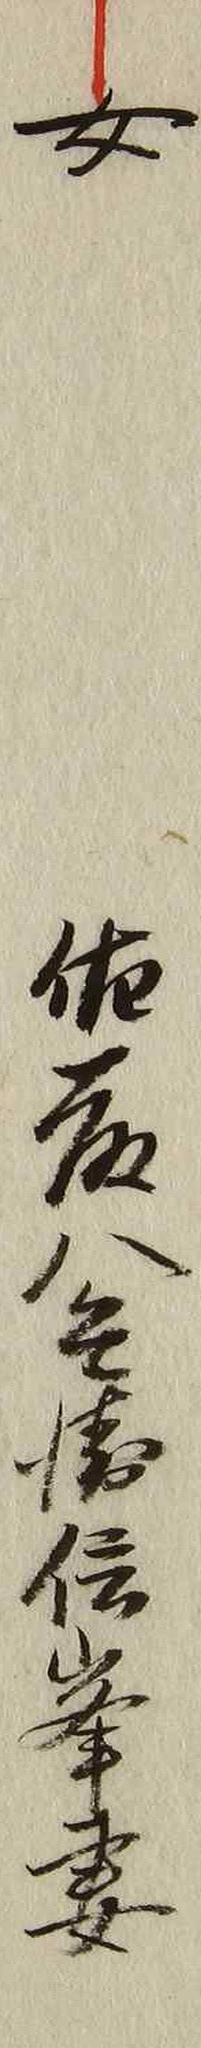女佐藤八兵衛信峰妻
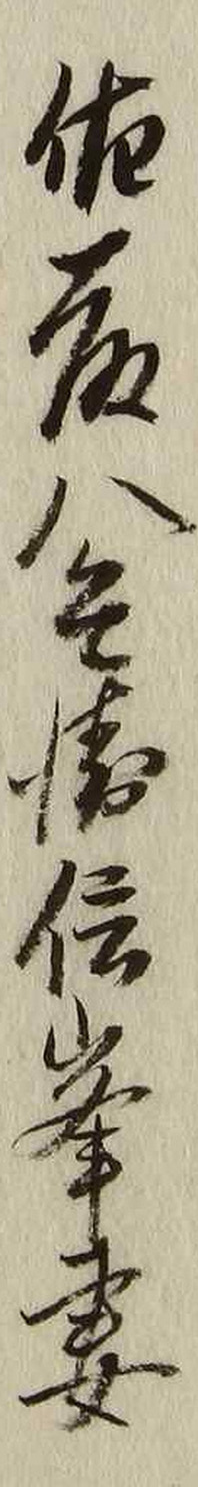女佐藤八兵衛信峰妻
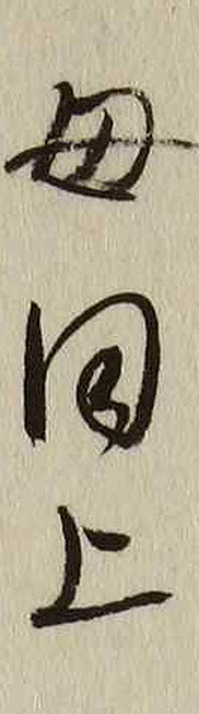母同上
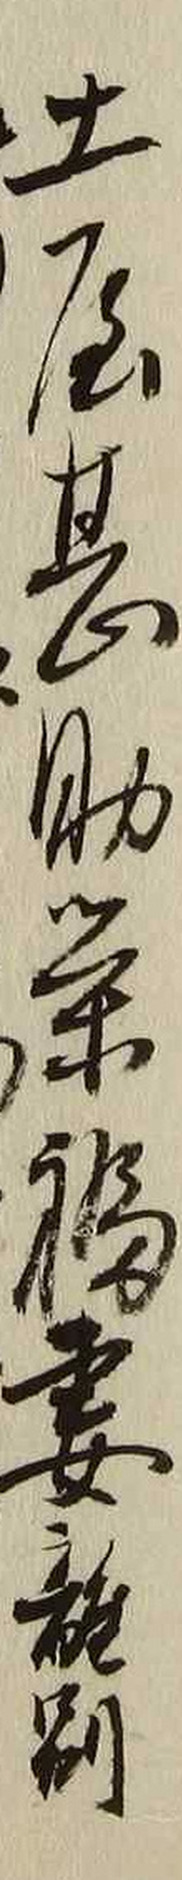女土屋甚助栄福妻離別
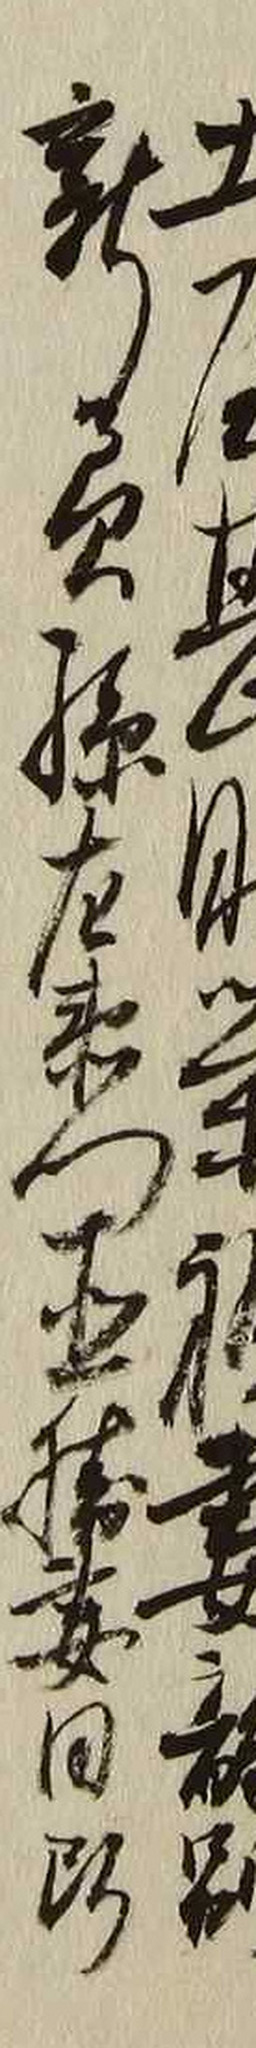新美孫左衛門直勝妻同断
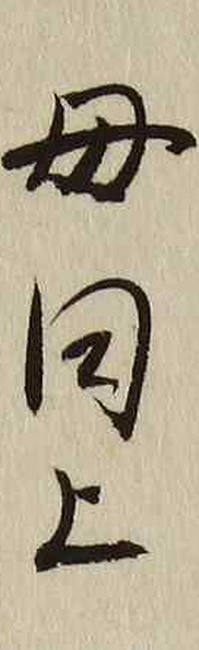母同上
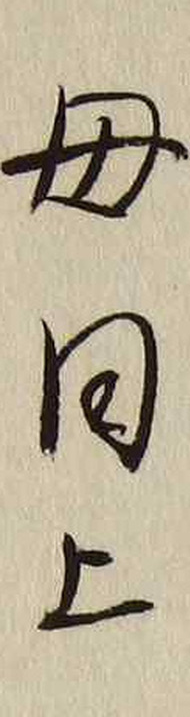母同上
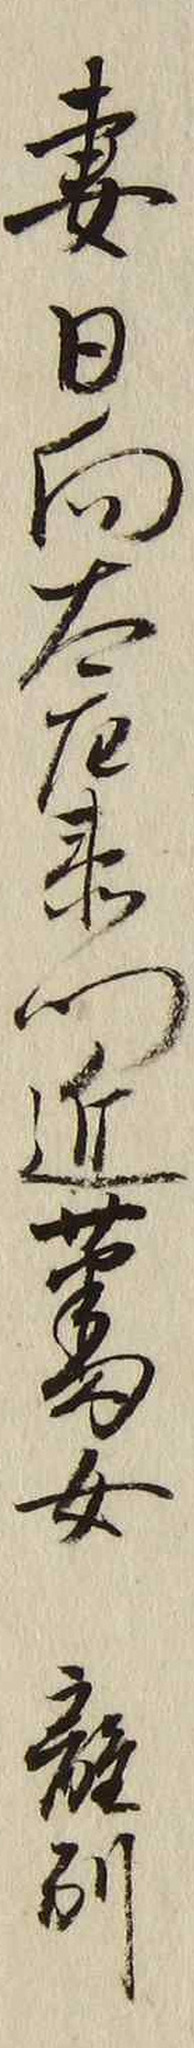妻日向太左衛門近蕃女離別

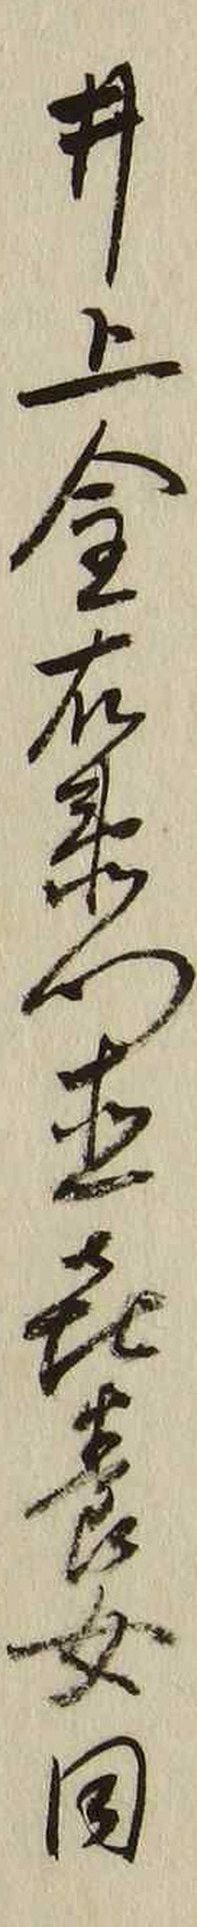井上金右衛門直喜養女同
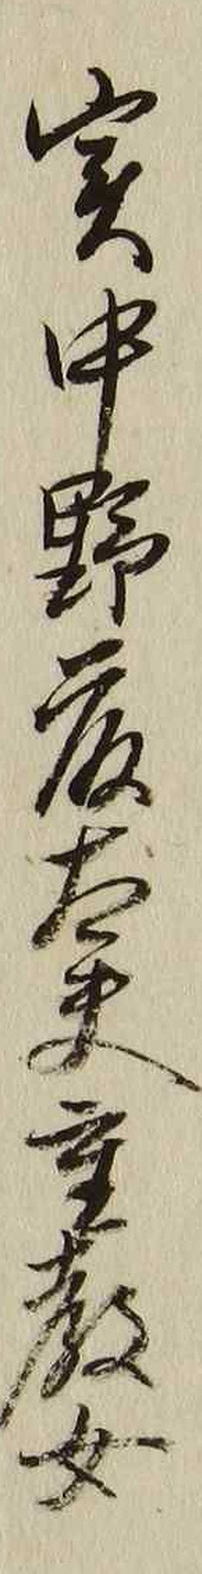実中野藤太夫重教女
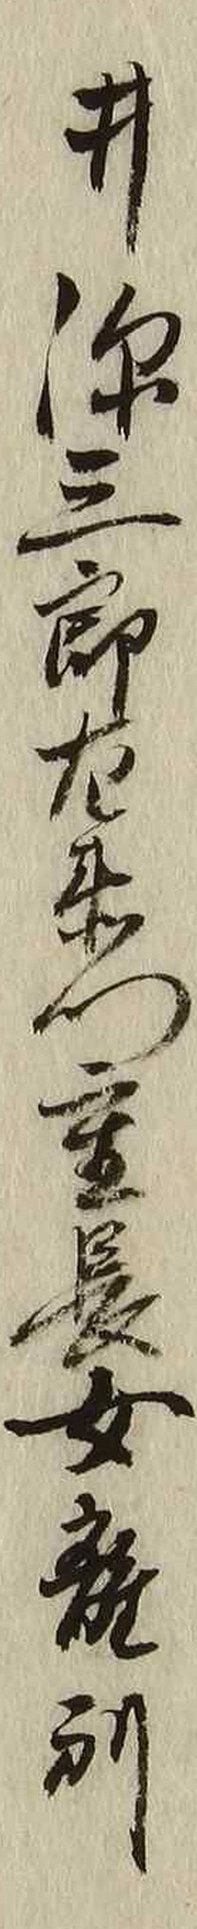井深三郎左衛門重長女離別
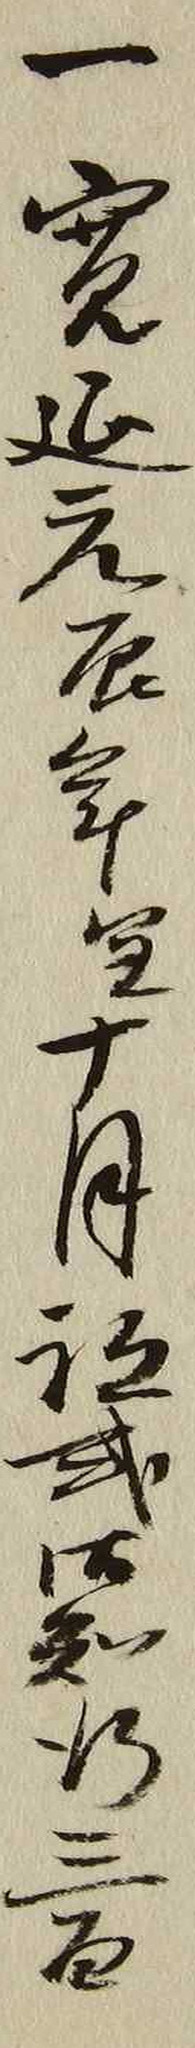一寛延元辰年閏十月跡式御知行三百
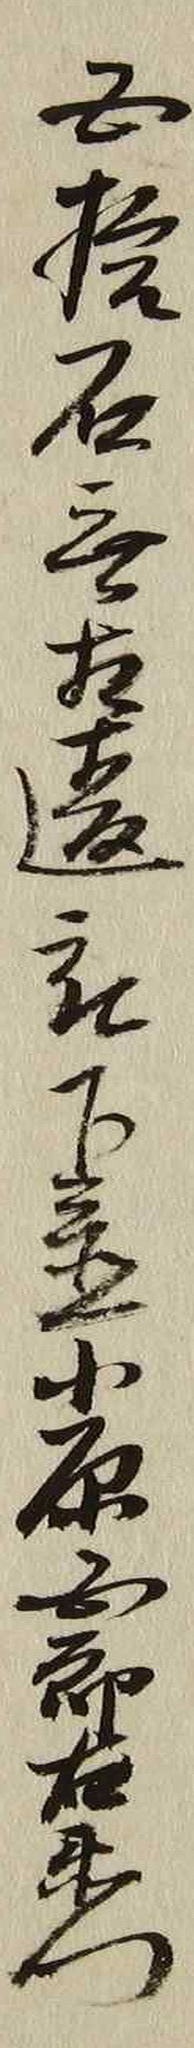五拾石無相違被下置小原五郎右衛門
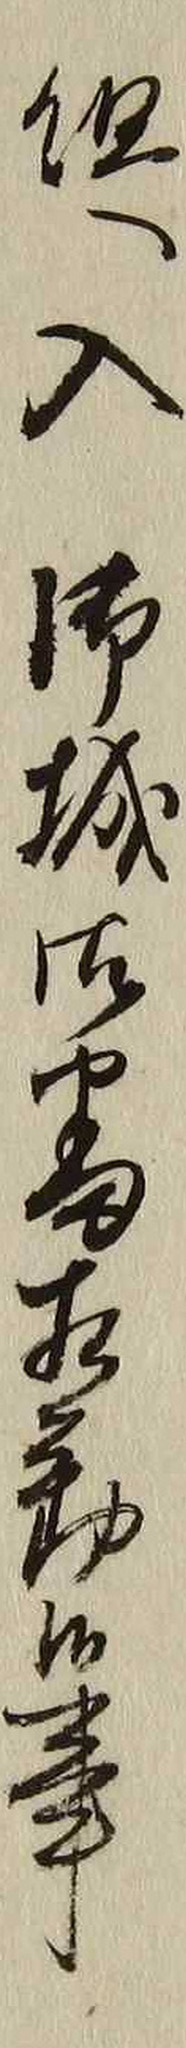組へ入御城御番相勤候事
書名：諸士系譜　巻之356　す之部6
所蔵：会津若松市立会津図書館
